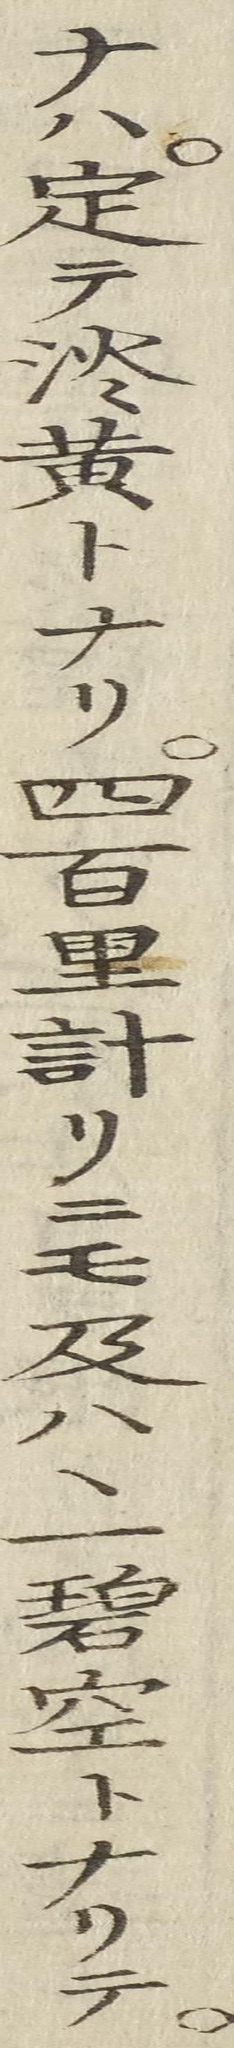ナハ。定テ淡黄トナリ。四百里計リニモ及ハヽ一碧空トナリテ。
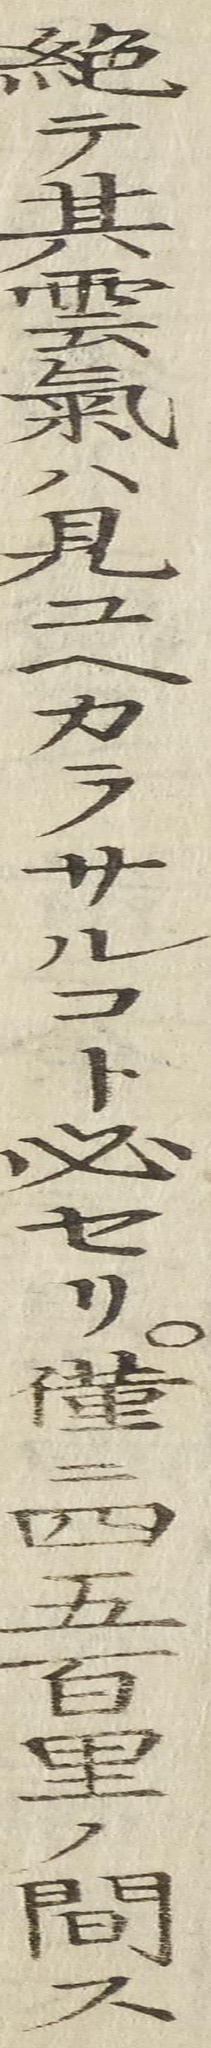絶テ其雲気ハ見ユヘカラサルコト必セリ。僅ニ四五百里ノ間ス
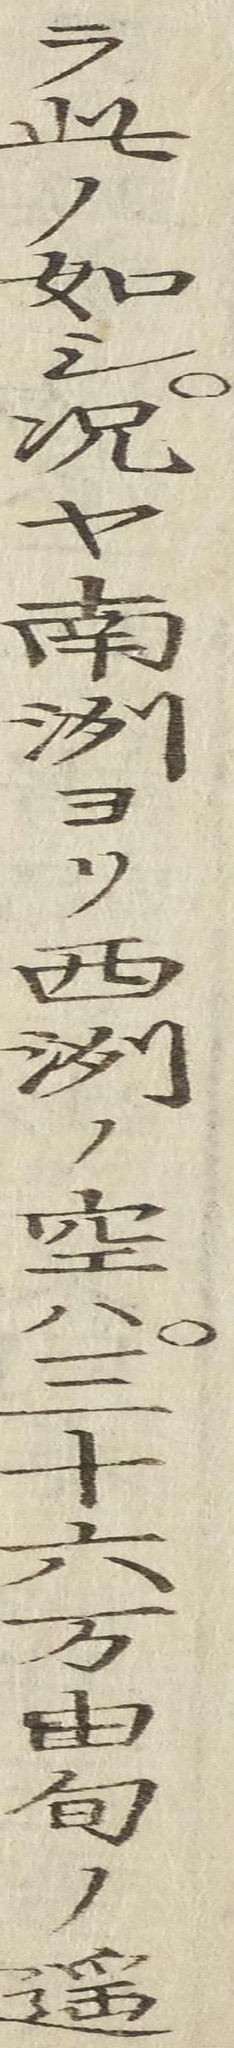ラ此ノ如シ。況ヤ南洲ヨリ西洲ノ空ハ。三十六万由旬ノ遥
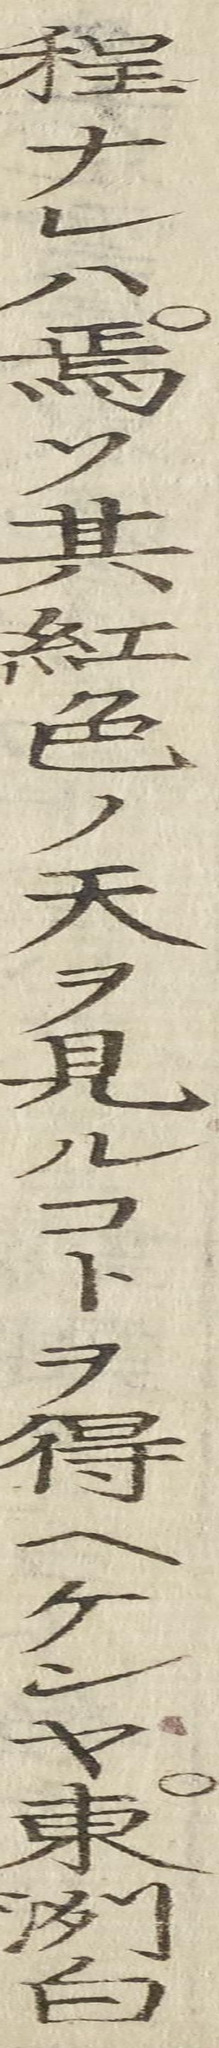程ナレハ。焉ソ其紅色ノ天ヲ見ルコトヲ得ヘケンヤ。東洲白
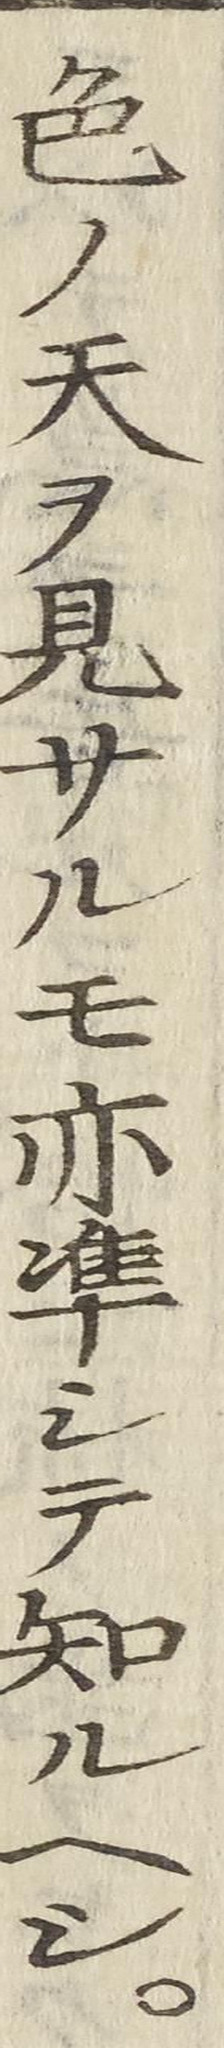色ノ天ヲ見サルモ亦準シテ知ルヘシ。
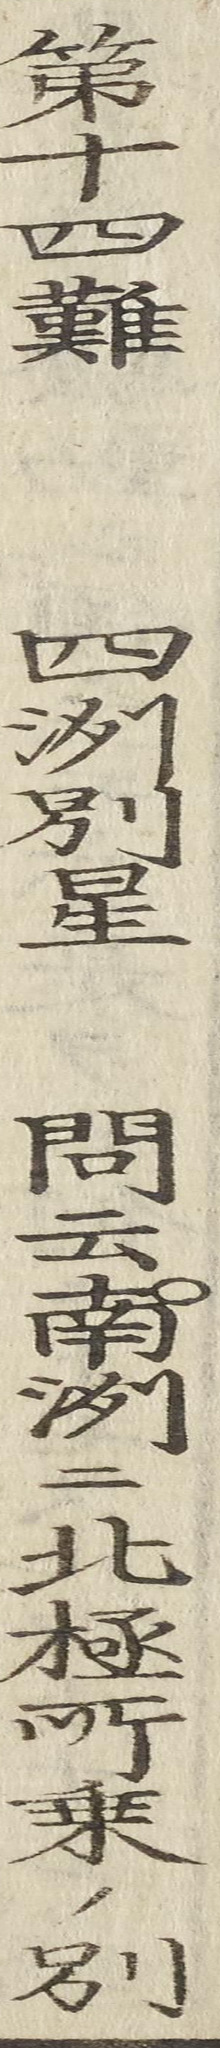第十四難四洲別星問云。南洲ニ北極所乗ノ別
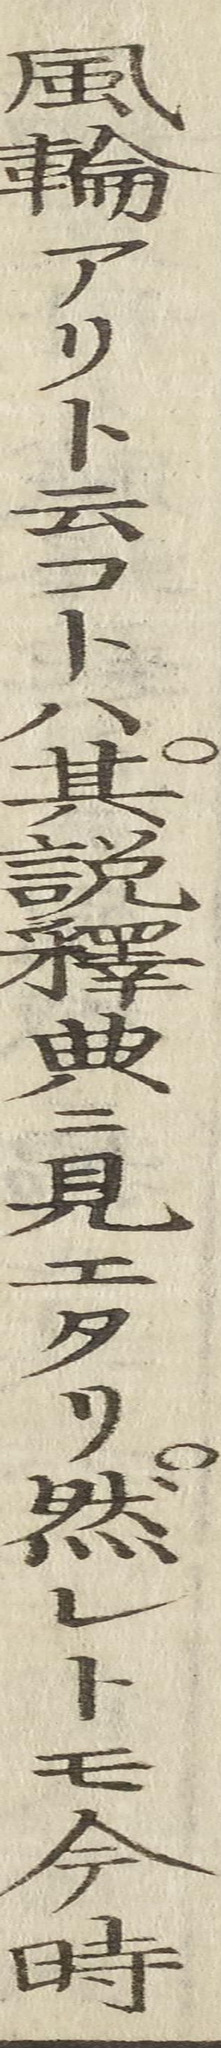風輪アリト云コトハ。其説釈典ニ見エタリ。然レトモ今時
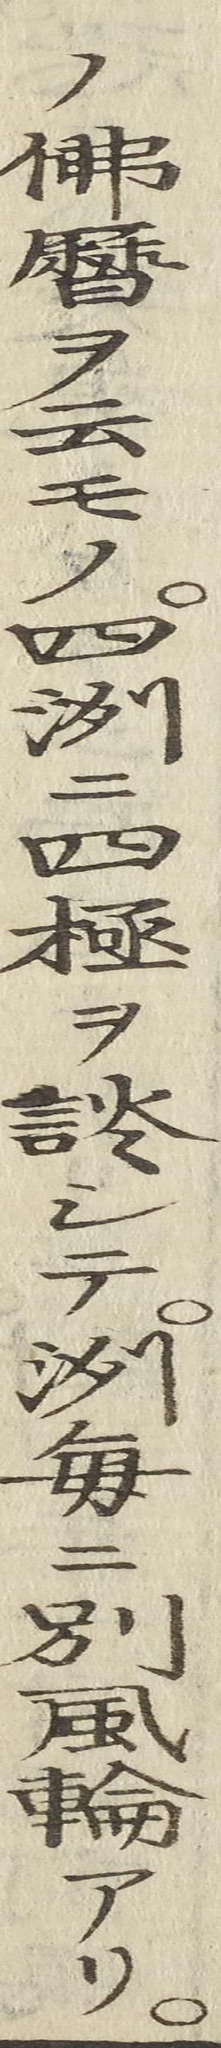ノ仏暦ヲ云モノ。四洲ニ四極ヲ談シテ。洲毎ニ別風輪アリ。
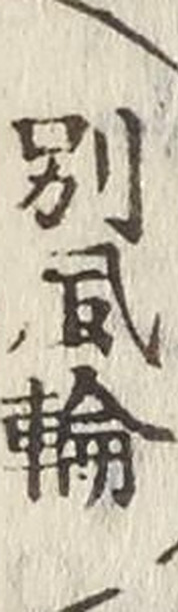別風輪
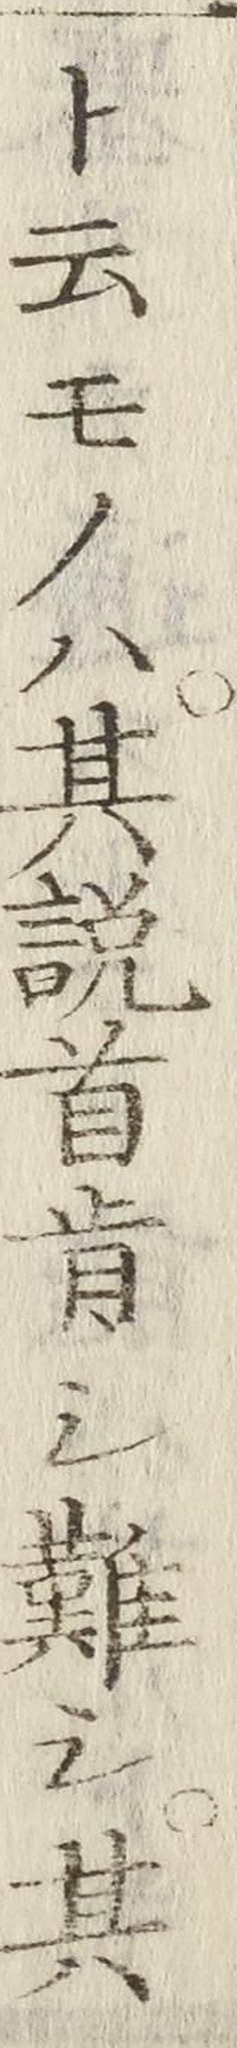ト云モノハ。其説首肯シ難シ。其
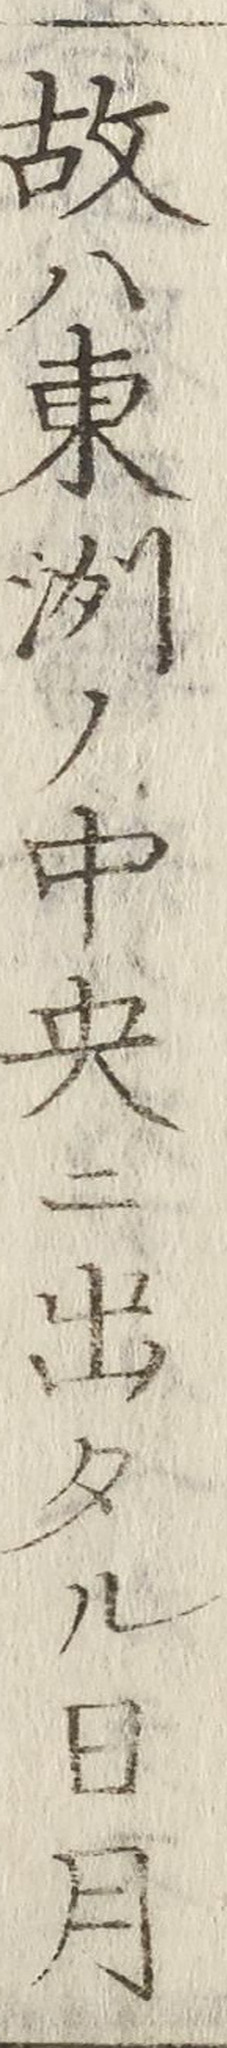故ハ東洲ノ中央ニ出タル日月
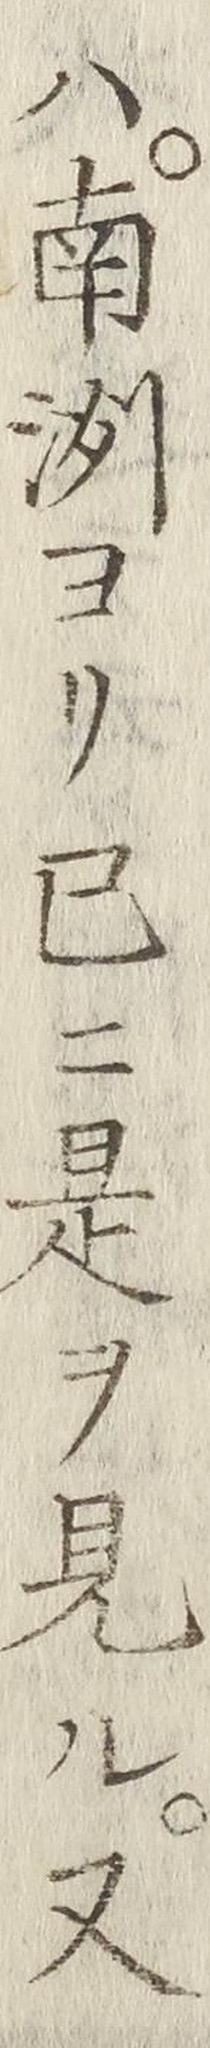ハ。南洲ヨリ已ニ是ヲ見ル。又
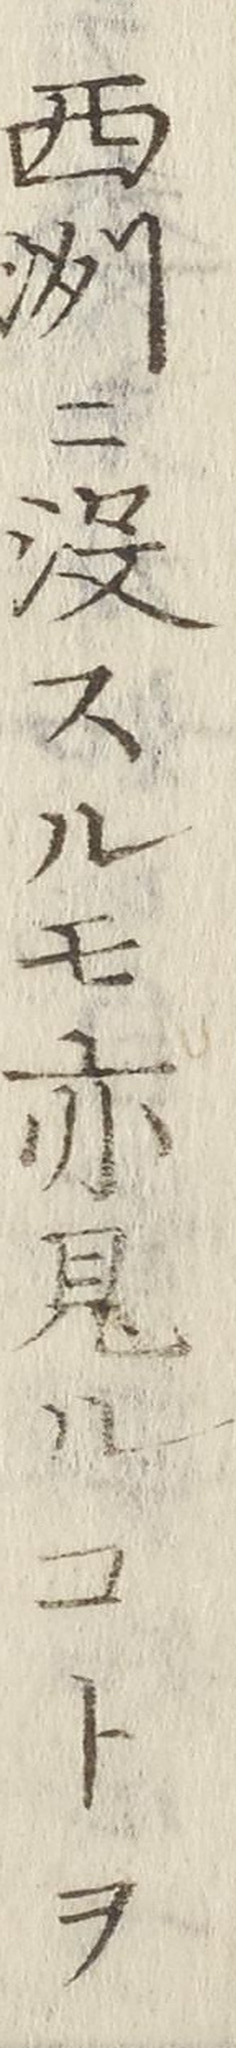西洲ニ没スルモ亦見ルコトヲ
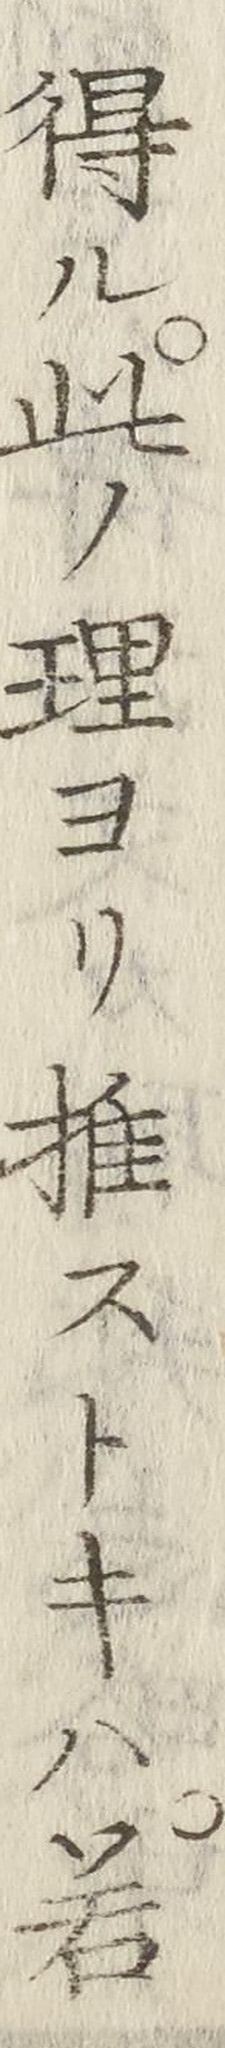得ル。此ノ理ヨリ推ストキハ。若
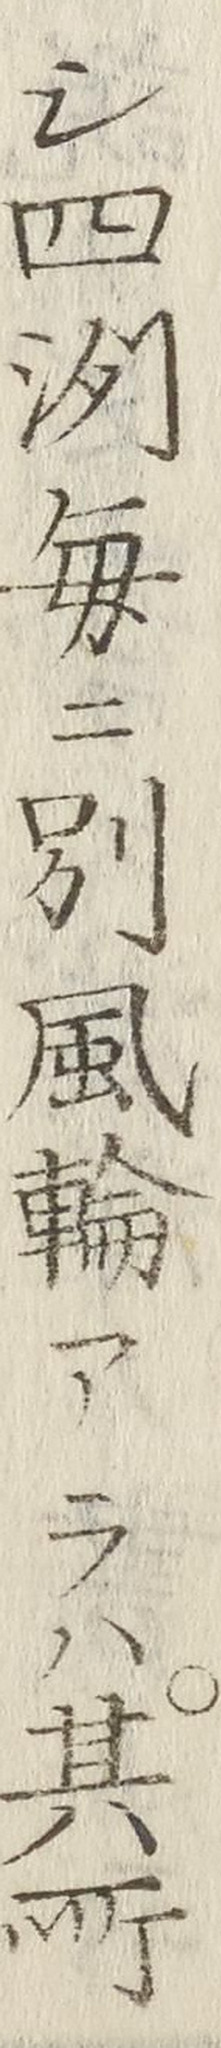シ四洲毎ニ別風輪アラハ。其所
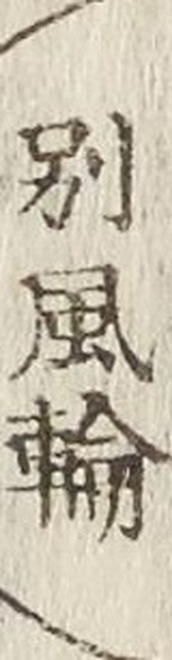別風輪
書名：護法新論　二編　上
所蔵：東京大学地震研究所図書室 Earthquake Research Institute Library, The University of Tokyo, JAPAN
